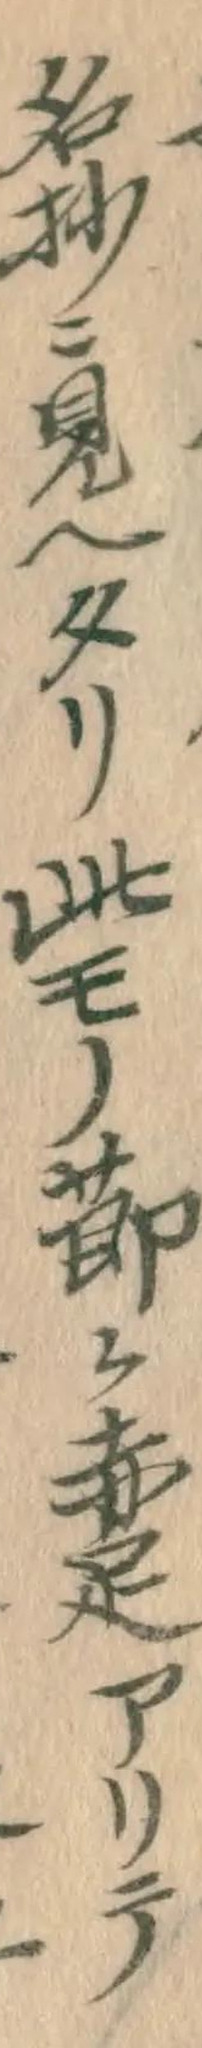名抄ニ見ヘタリ此モノ々赤足アリテ
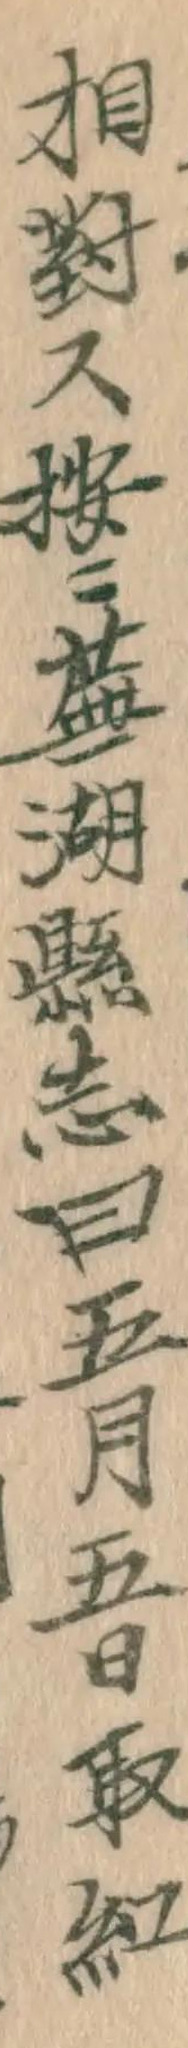相對ス按ニ蕪湖縣志曰五月五日取紅
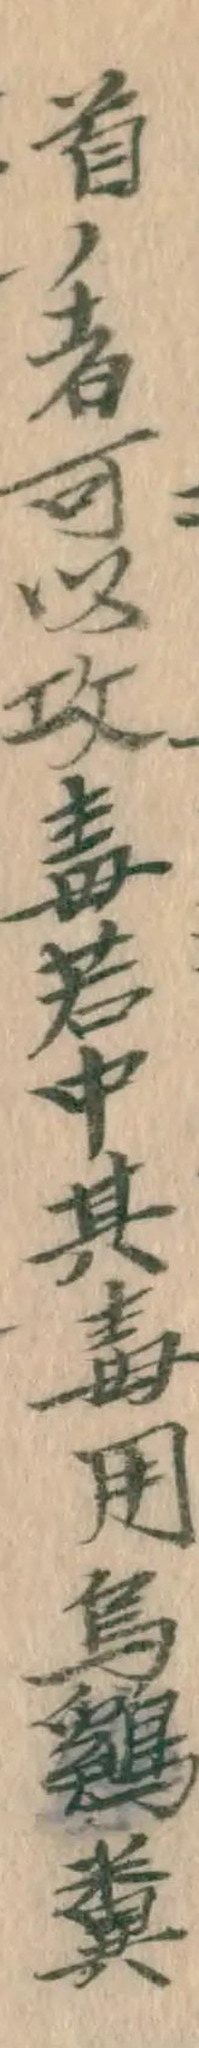首ノ者可以攻毒若中其毒用鳥鶏糞
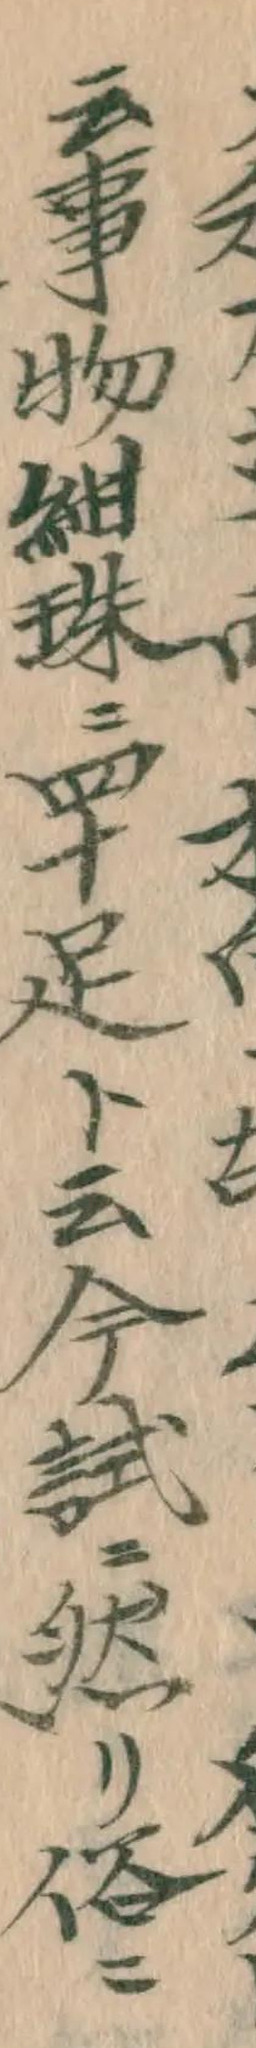云事物紺珠ニ四十足ト云今試ニ然リ俗ニ
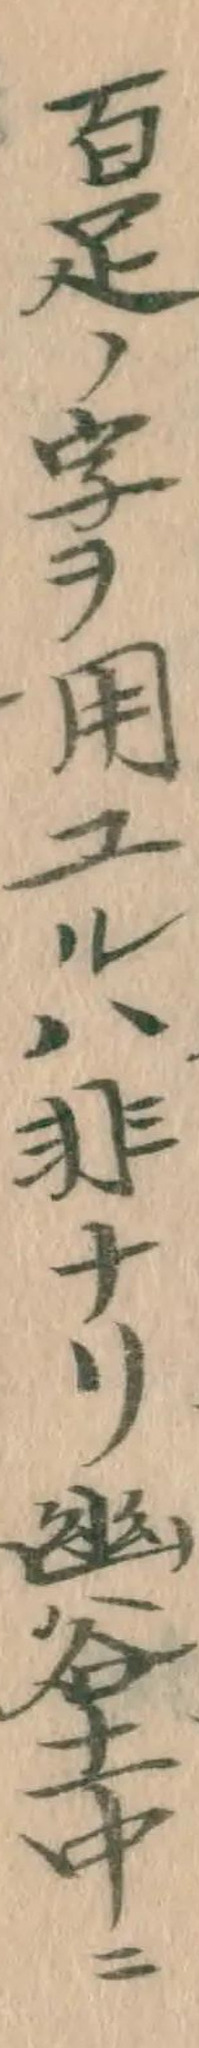百足ノ字ヲ用ユルハ非ナリ幽谷土中ニ
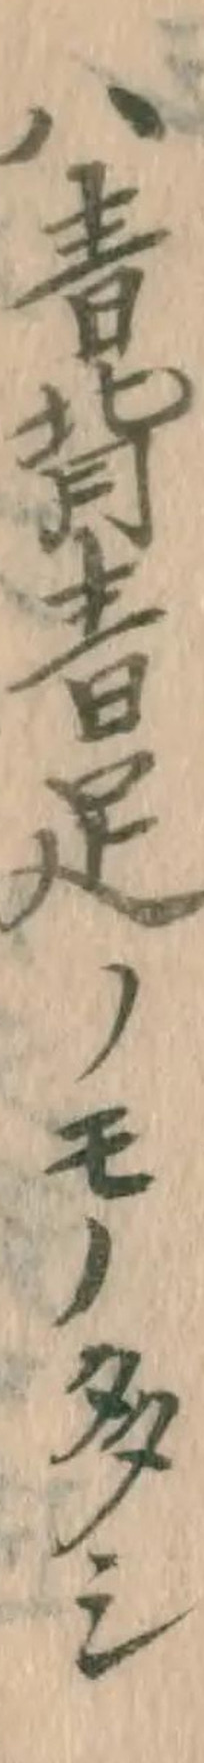ハ青背青足ノモノ多シ
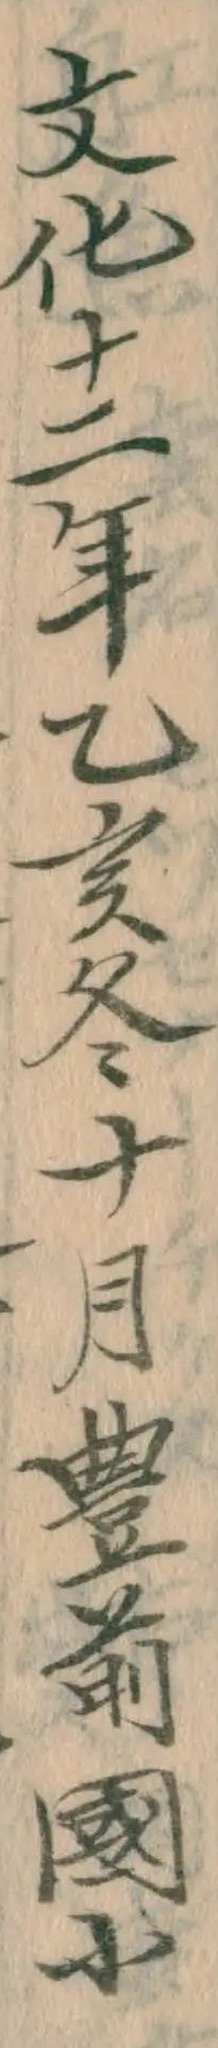文化十二年乙亥冬十月豊前國小
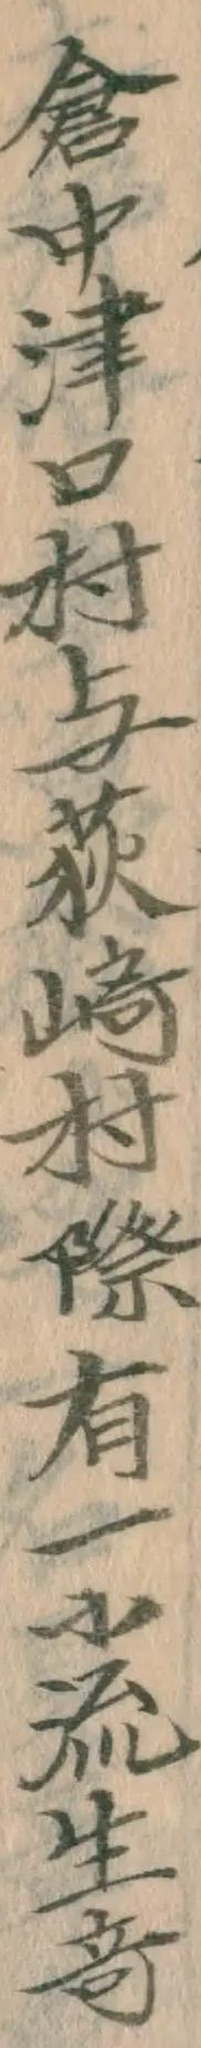倉中津口村与荻崎村際有一小流生奇
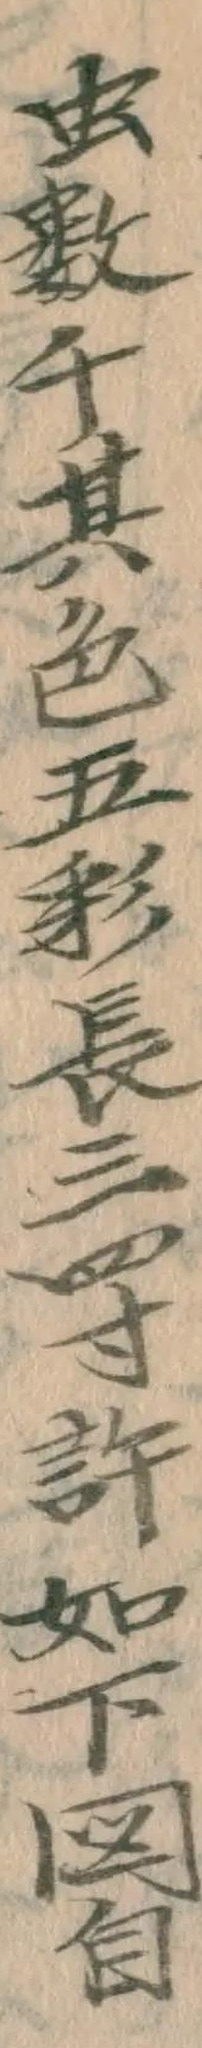虫数千其色五彩長三四寸許如下図自
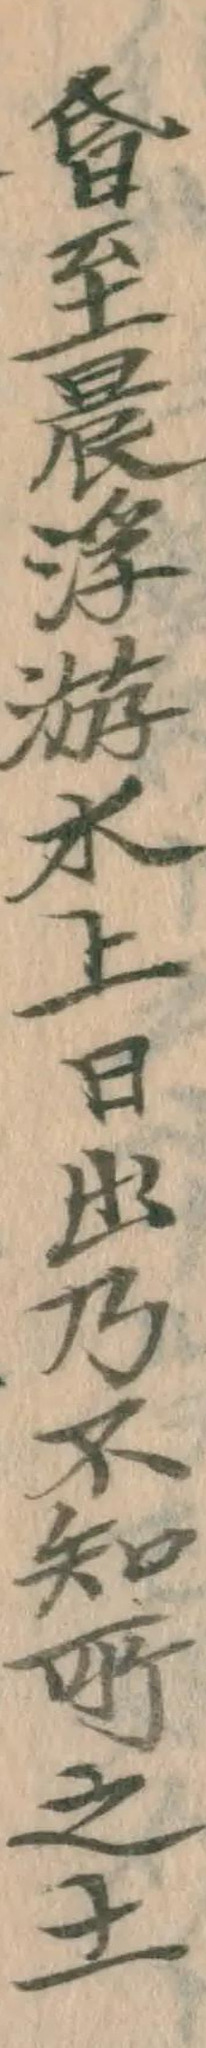昏至晨浮游水上日出乃不知所之土
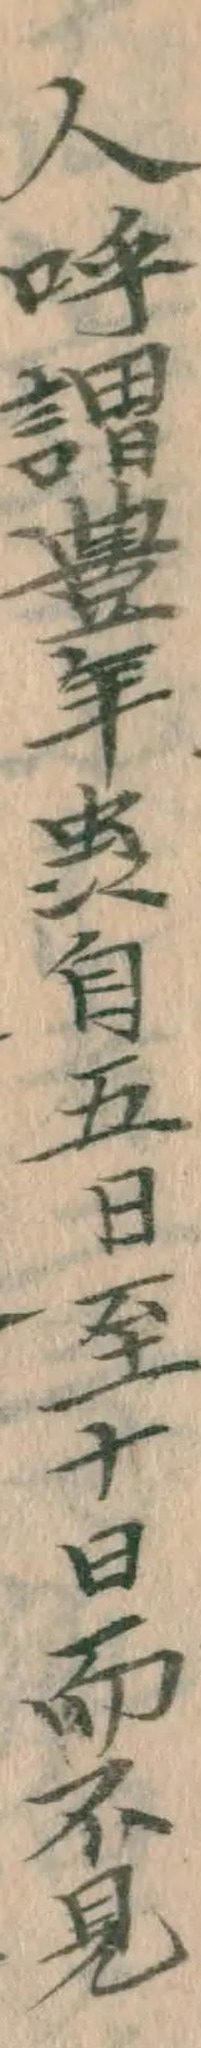人呼謂豊年蟲自五日至十日而不見
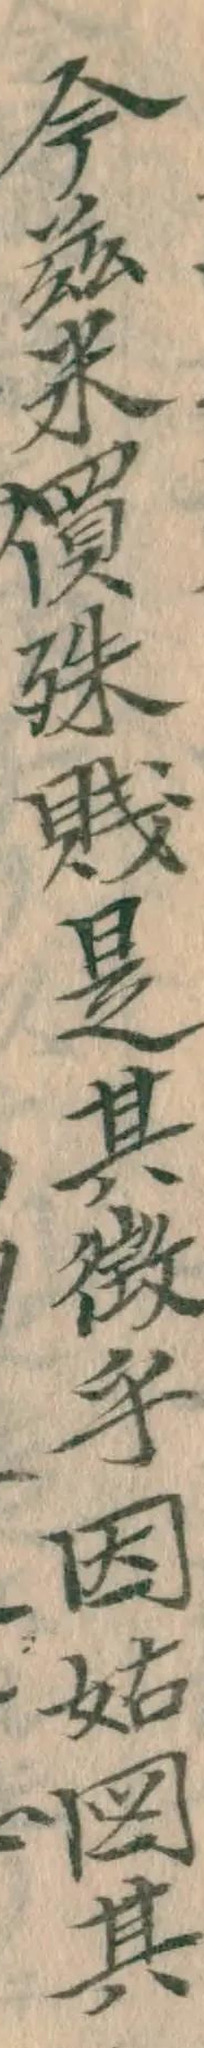今茲米價殊賎是其徴乎因姑図其
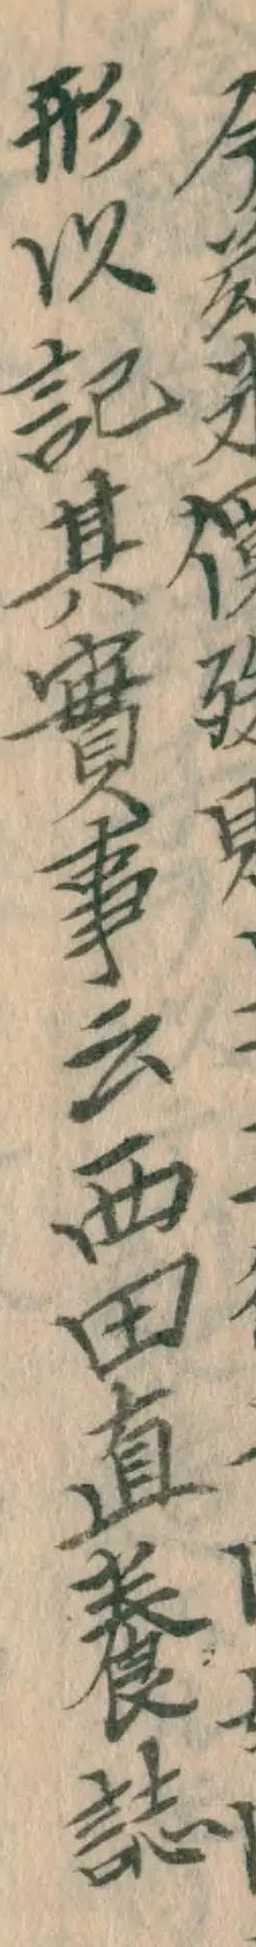形以記其實事云西田直養誌
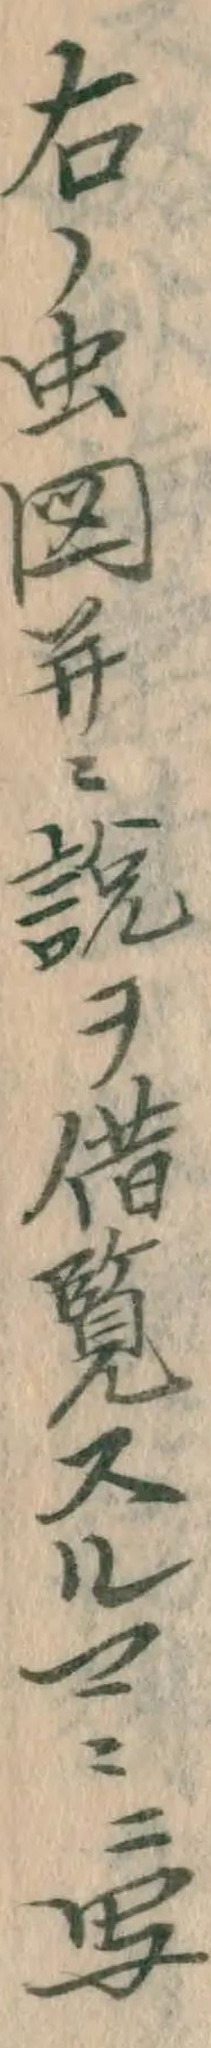右ノ虫図幷ニ説ヲ借覧スルマヽニ写
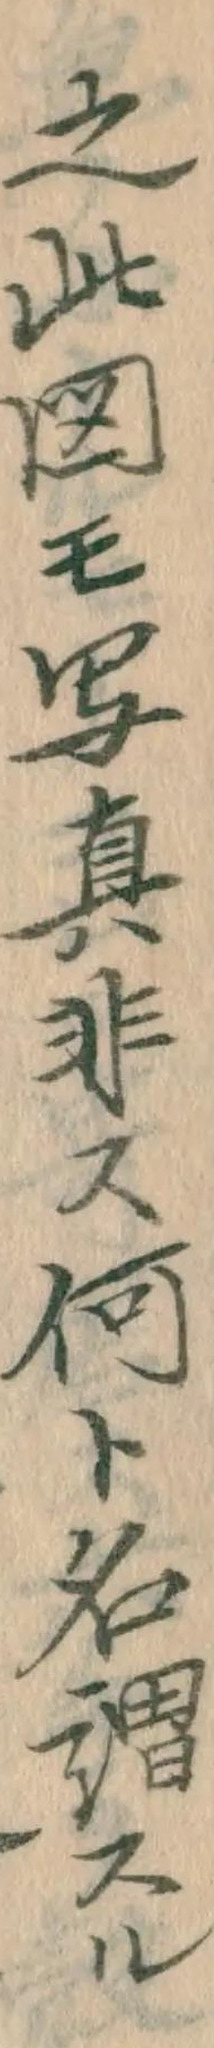之此図モ写真非ス何ト名謂スル
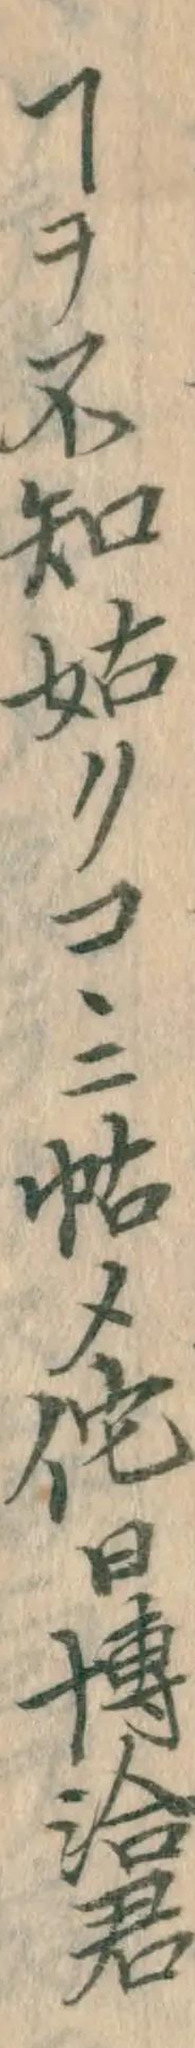コトヲ不知姑クコヽニ帖シテ侘日博洽君
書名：千蟲譜 3巻. [2]
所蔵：国立国会図書館 National Diet Library, JAPAN
